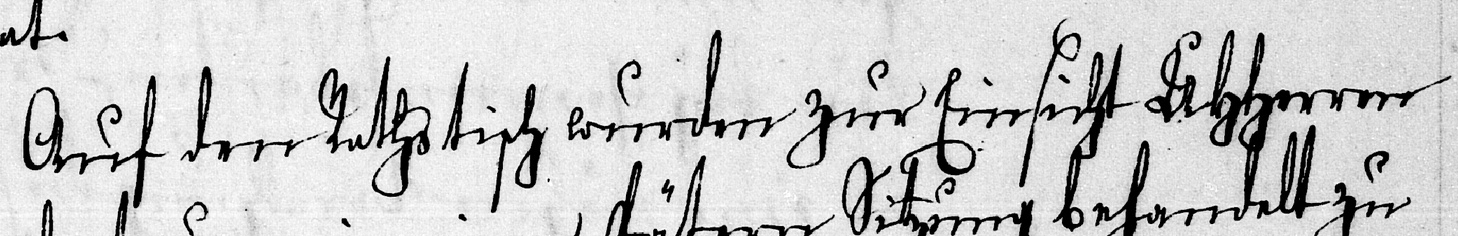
Auf den Rathstisch wurden zur Einsicht UHHerren
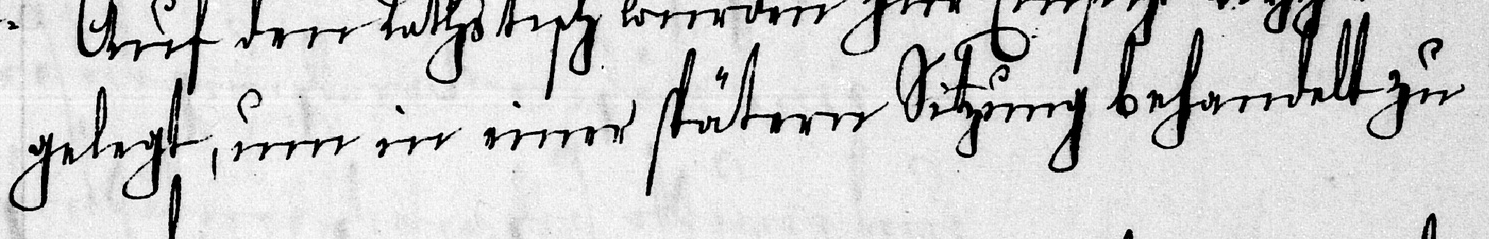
gelegt, um in einer spätern Sitzung behandelt zu
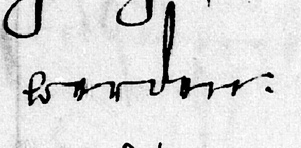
werden:
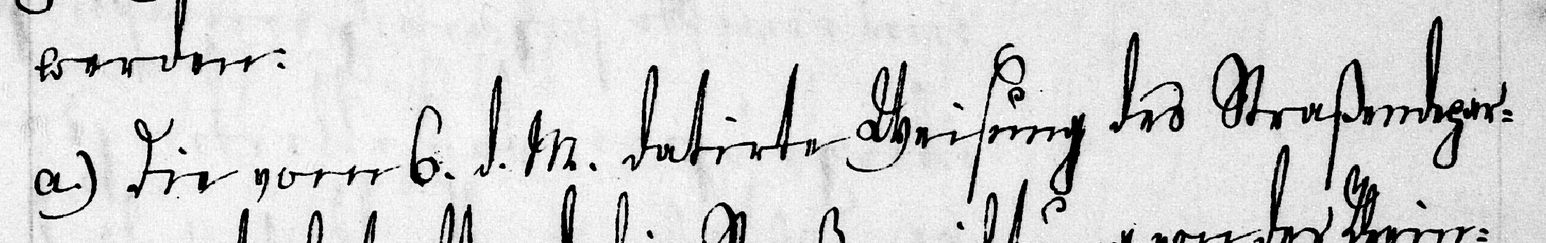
c.) Die vom 6. d. M. datirte Weisung des Straßendepar¬
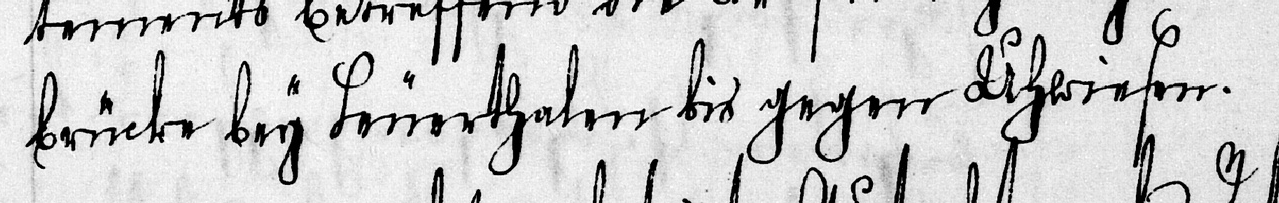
brücke bey Feuerthalen bis gegen Uhwiesen.
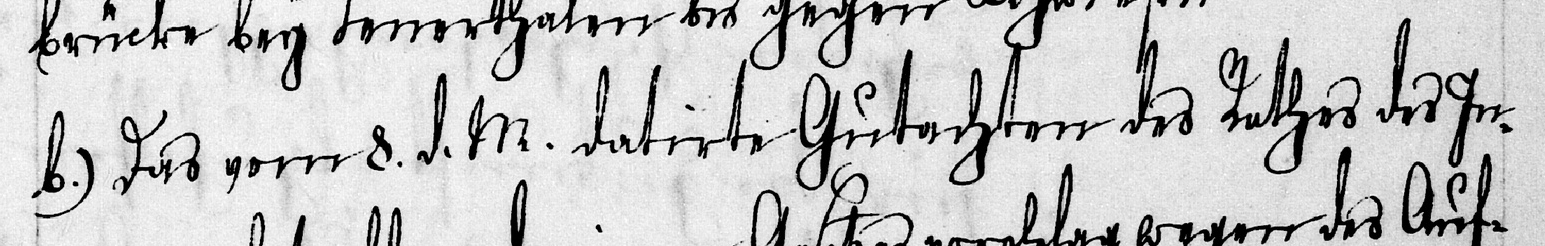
b.) Das vom 8. d. M. datirte Gutachten des Rathes des In¬
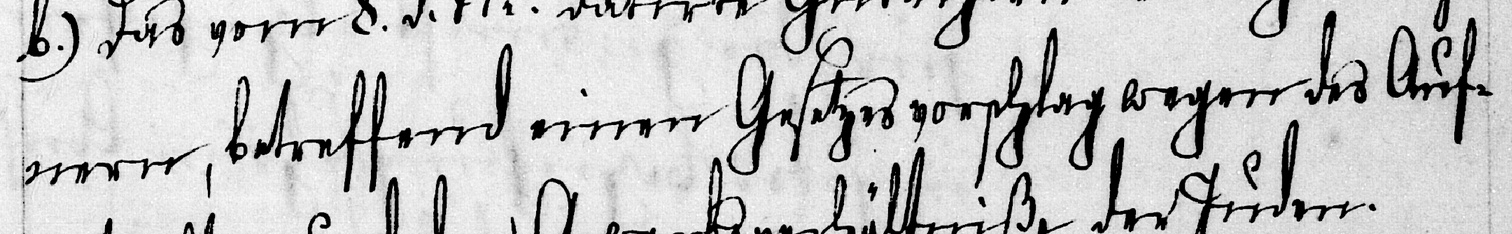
nern, betreffend einen Gesetzesvorschlag wegen des Auf¬
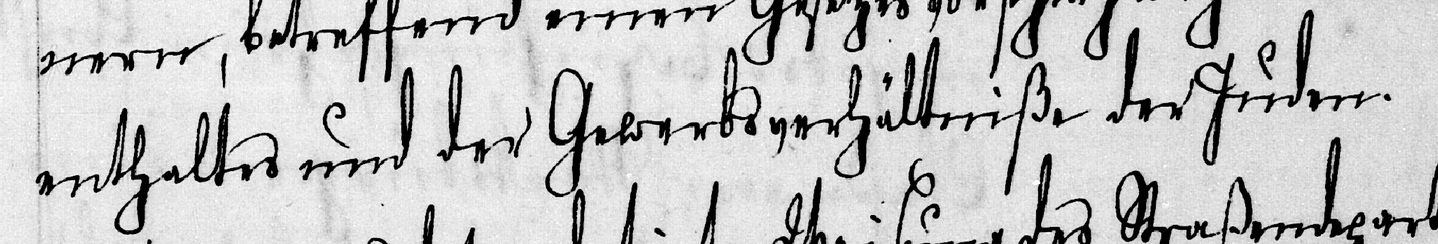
enthaltes und der Gewerbsverhältniße der Juden.
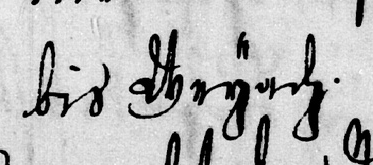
bis Weyach.
